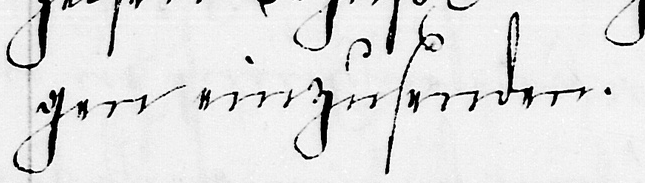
gen einzusenden.
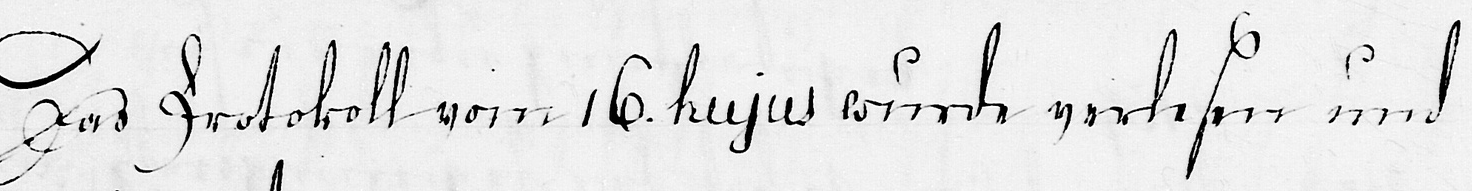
Das Protokoll vom 16. hujus wurde verlesen und
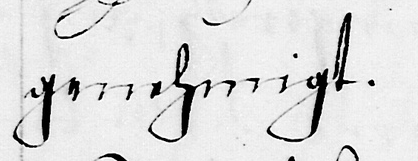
genehmigt.
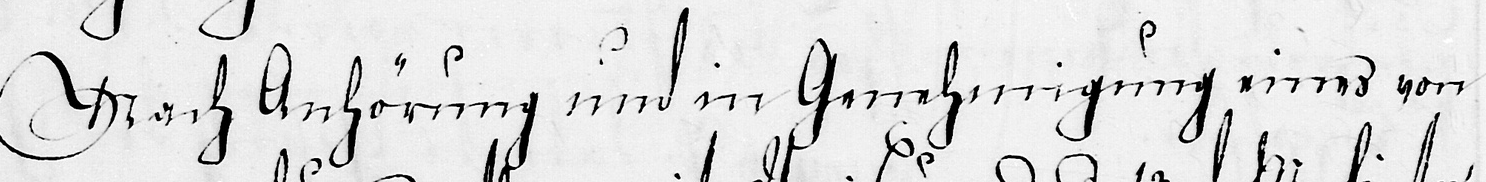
Nach Anhörung und in Genehmigung eines von
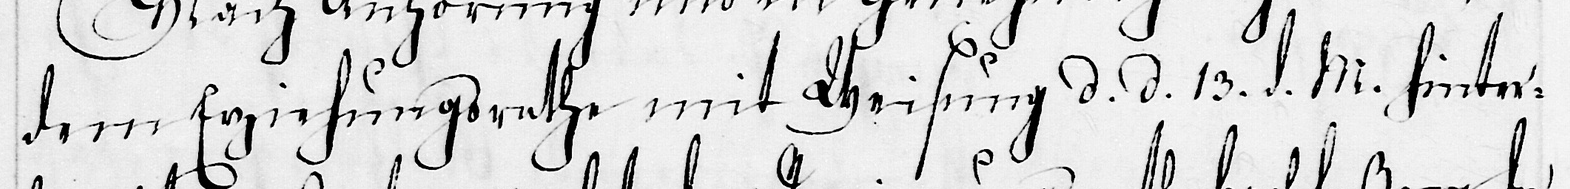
dem Erziehungsrathe mit Weisung d. d. 13. d. M. hinter¬
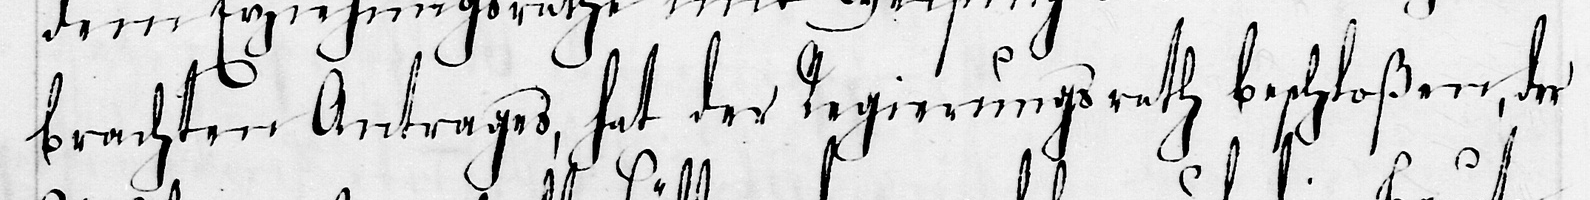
brachten Antrages, hat der Regierungsrath beschloßen, der
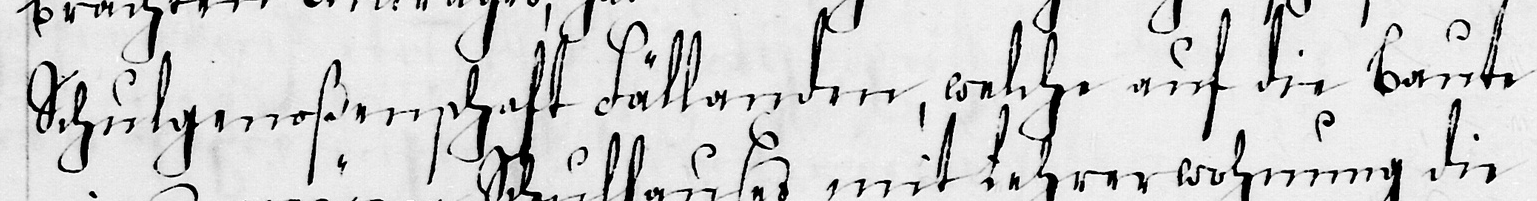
Schulgenoßenschaft Fällanden, welche auf die Baute
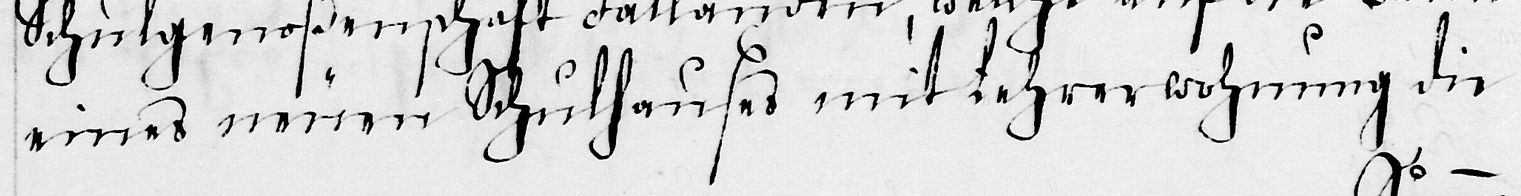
eines neuen Schulhauses mit Lehrerwohnung die
